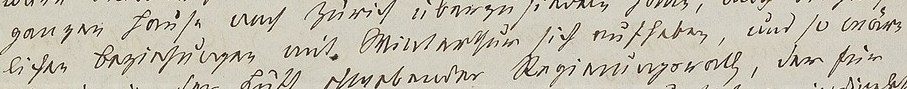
lichen Beziehungen mit Winterthur sich aufheben, und so wäre
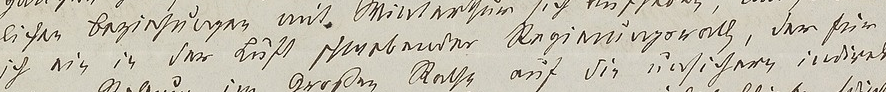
ich ein in der Luft schwebender Regierungsrath, der für
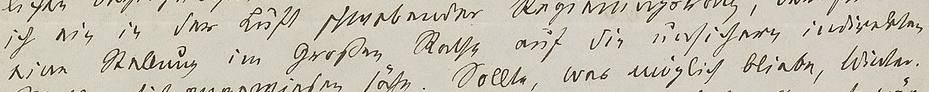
eine Stellung im Großen Rathe auf die unsichere indirekten
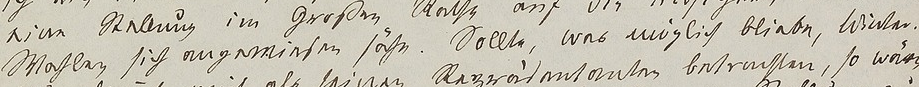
Wahlen sich angewiesen sähe. Sollte, was möglich bliebe, Winter-
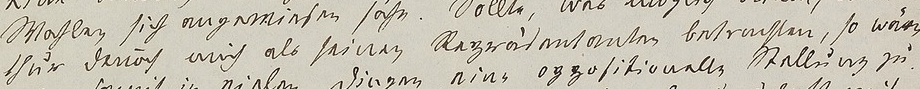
thur dennoch mich als seinen Repräsentanten betrachten, so wäre
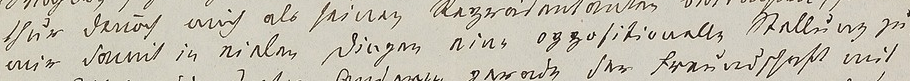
mir damit in vielen Dingen eine oppositionelle Stellung zu-
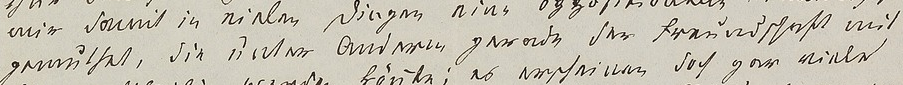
gemuthet, die unter Anderm gerade der Freundschaft mit
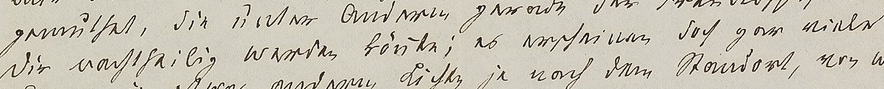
Dir nachtheilig werden könnte; es erscheinen doch gar viele
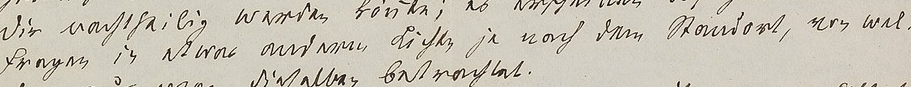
Fragen in etwas anderm Lichte je nach dem Standort, von wel-
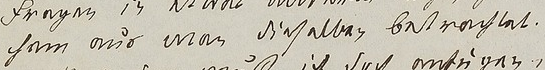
chem aus man dieselben betrachtet.
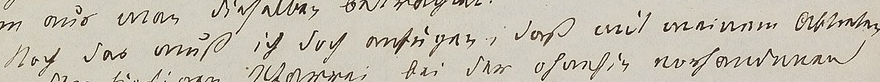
Noch das muß ich doch anfügen; daß mit meinem Abtreten
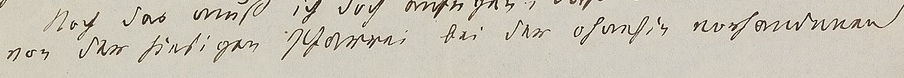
von der hiesigen Pfarrei bei der ohnehin vorhandenen
